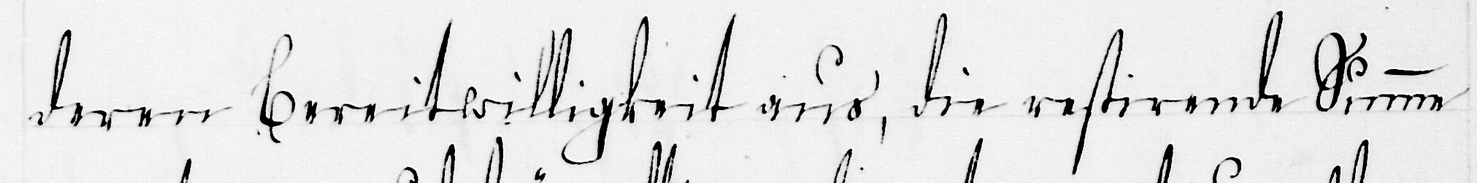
deren Bereitwilligkeit aus, die restirende Summe
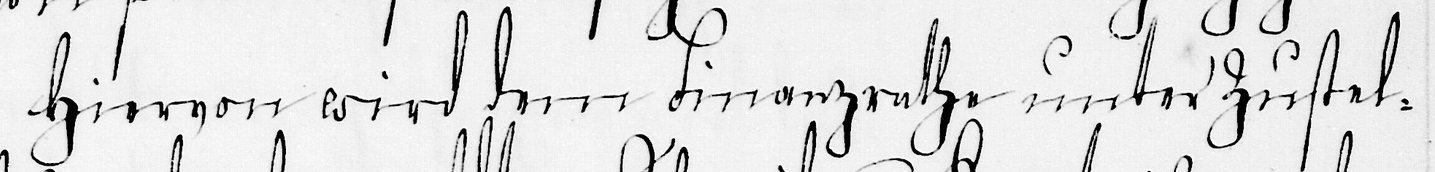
Hiervon wird dem Finanzrathe unter Zustel¬
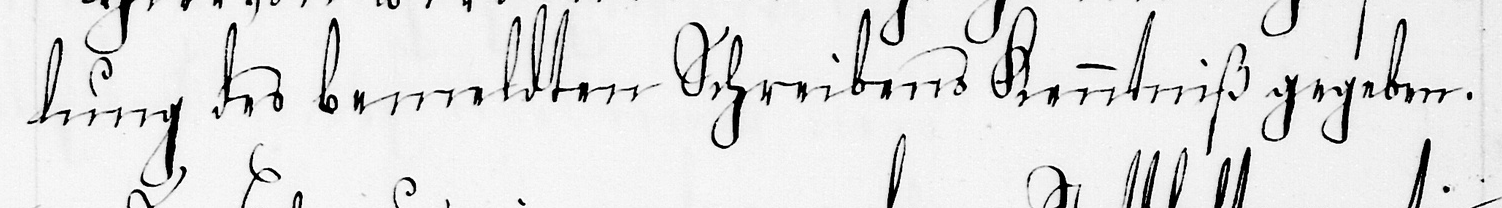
lung des bemeldten Schreibens Kenntniß gegeben.
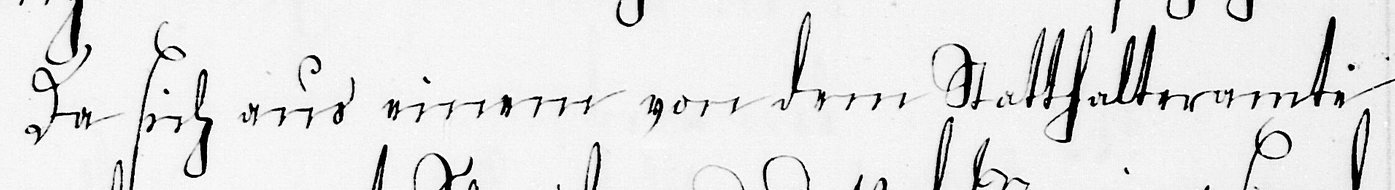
Da sich aus einem von dem Statthalteramte
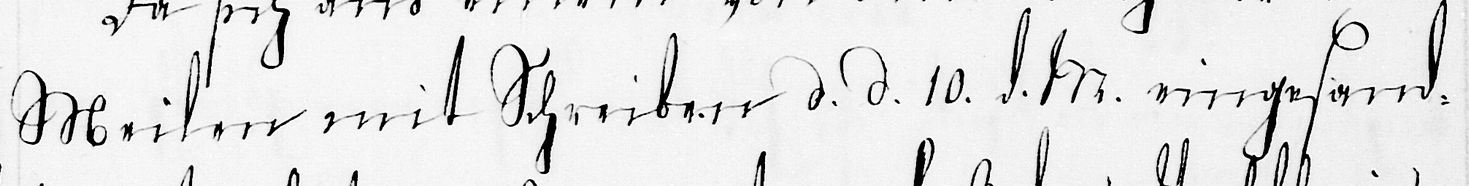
Meilen mit Schreiben d. d. 10. d. M. eingesand¬
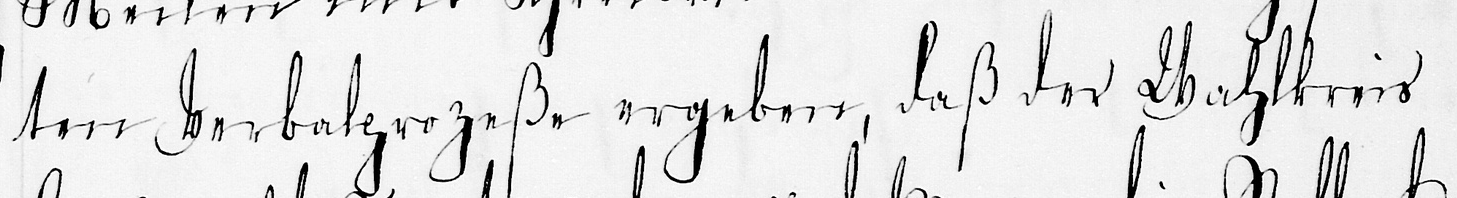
ten Verbalprozeße ergeben, daß der Wahlkreis
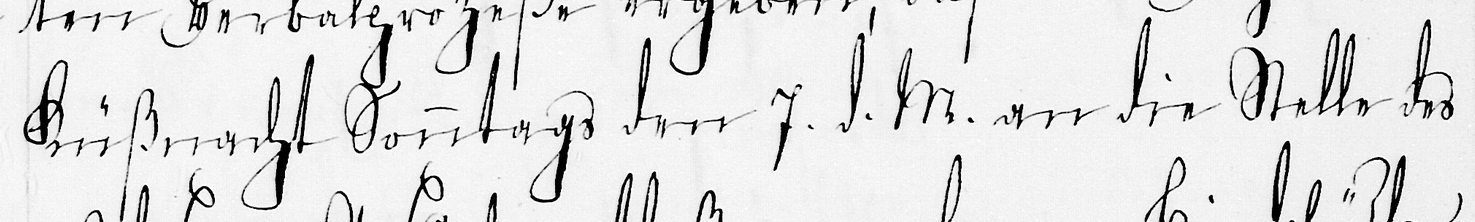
Küßnacht Sonntags den 7. d. M. an die Stelle des
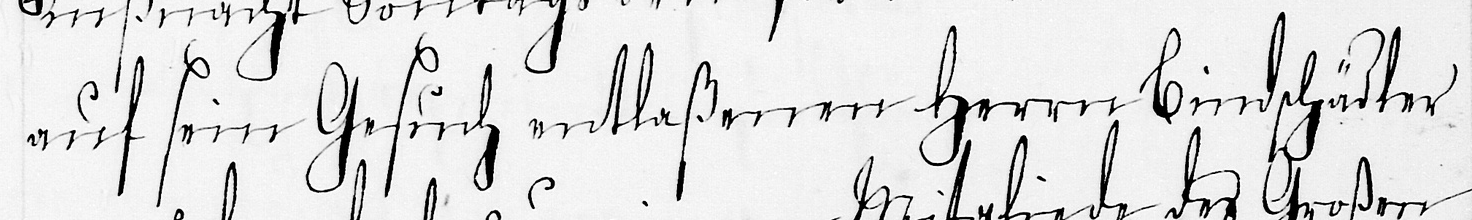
auf sein Gesuch entlaßenen Herrn Bindschädler
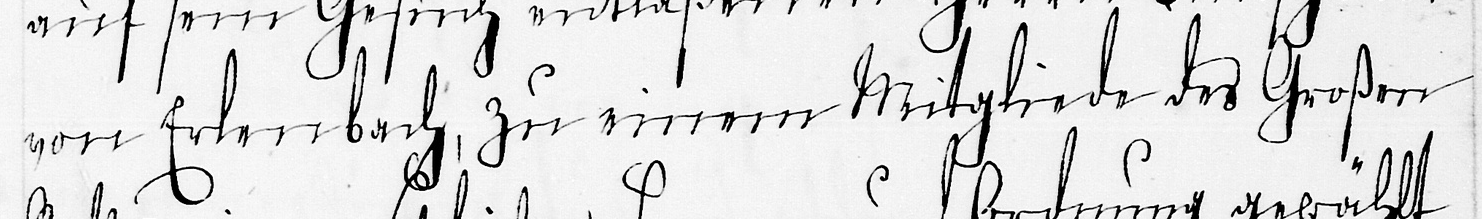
von Erlenbach, zu einem Mitgliede des Großen
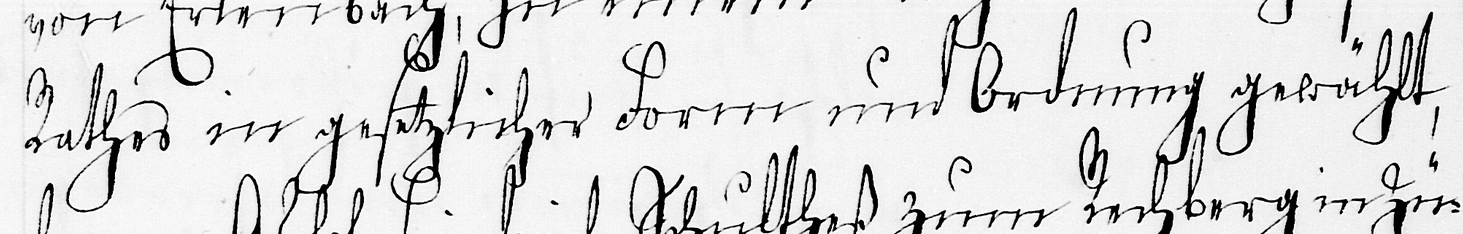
Rathes in gesetzlicher Form und Ordnung gewählt,
